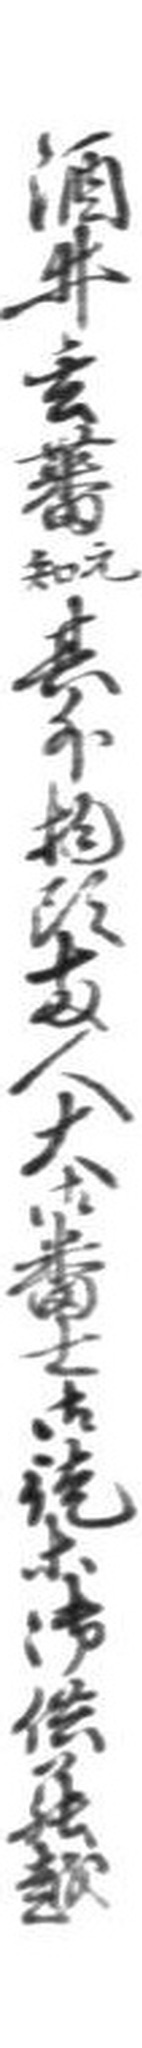酒井玄蕃元知其外物頭両人大御番士御徒等御供罷越
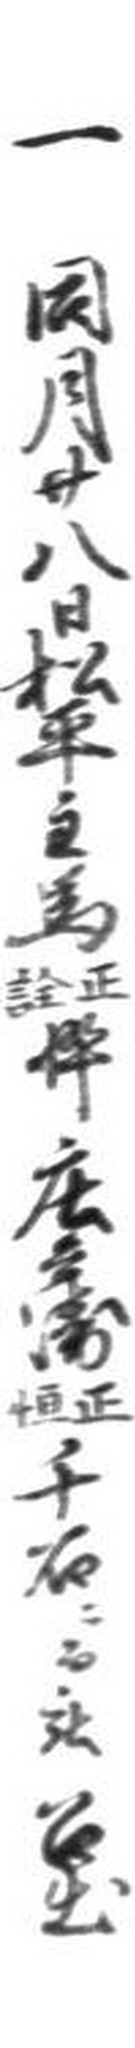一同月廿八日松平主馬正詮倅庄兵衛正恒千石ニ而被召出

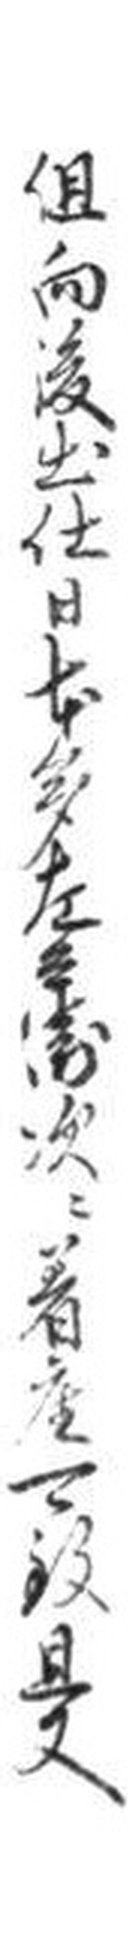但向後出仕日本多左兵衛次ニ着座可致且又
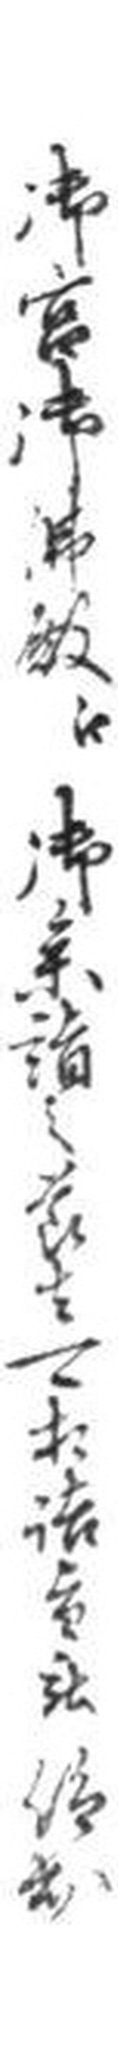御宮御仏殿江御参詣之節者可相詰旨被仰出
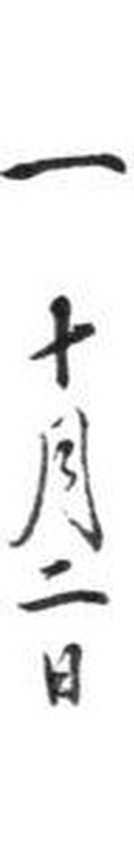一十月二日
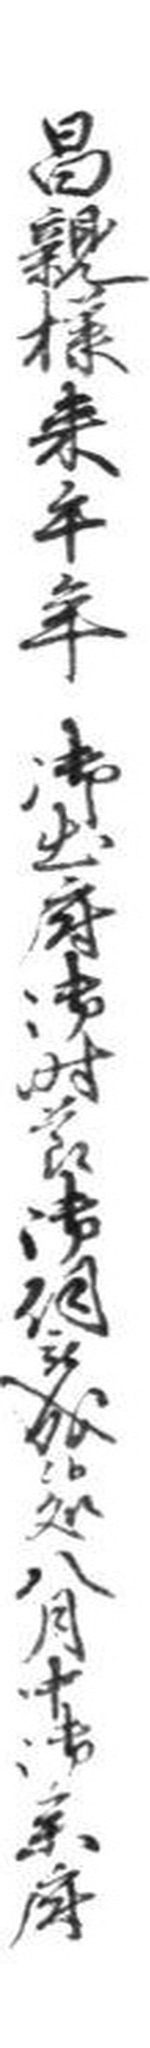昌親様来午年御出府御時節御伺被成候処八月中御参府
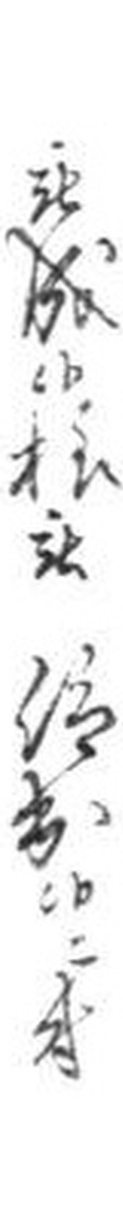被成候様被仰出候ニ付
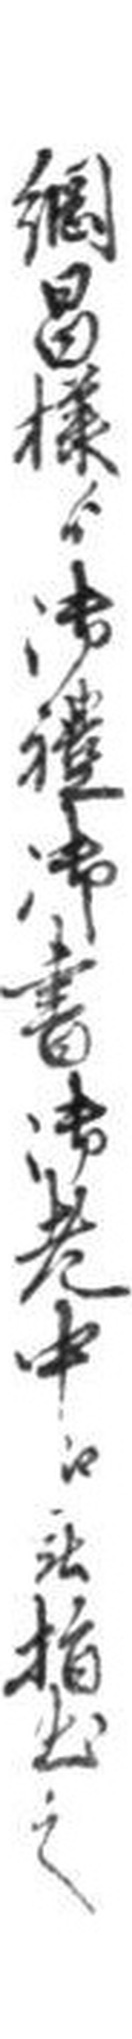綱昌様ゟ御礼御書御老中江被指出之
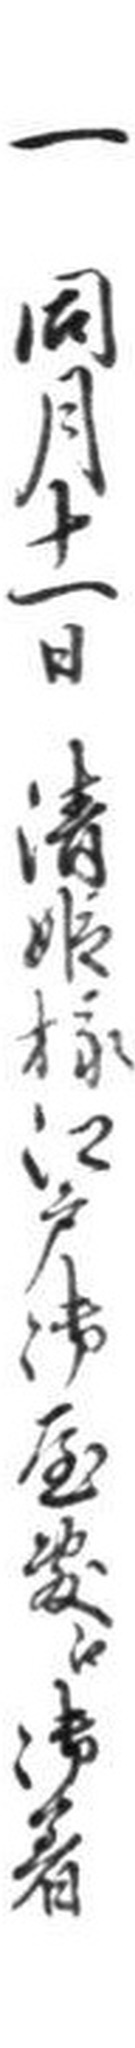一同月十一日清姫様江戸御屋敷江御着
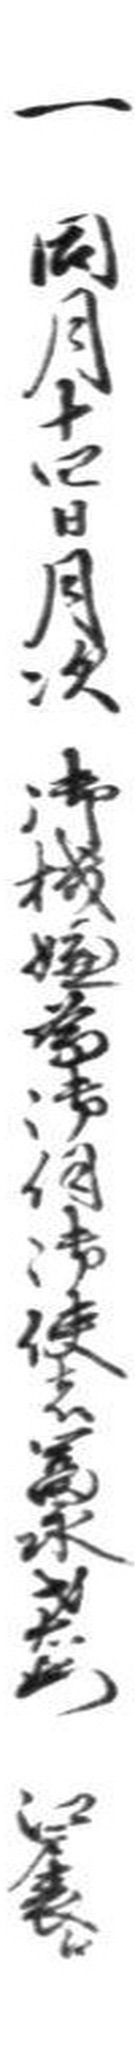一同月十四日月次御機嫌為御伺御使者冨永才右衛門江戸表江
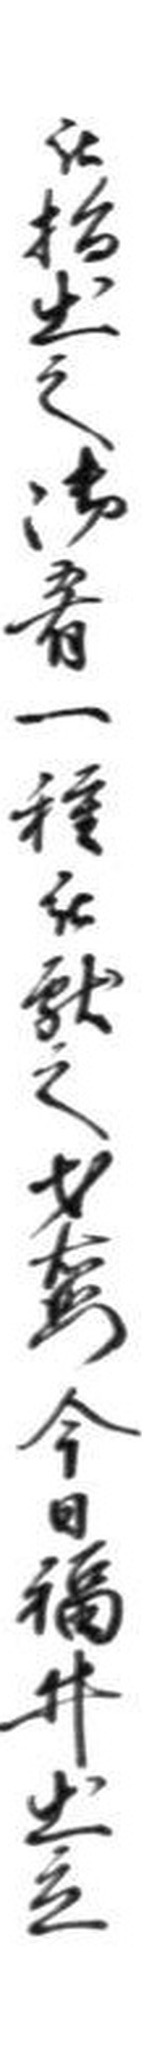被指出之御肴一種被献之才右衛門今日福井出立
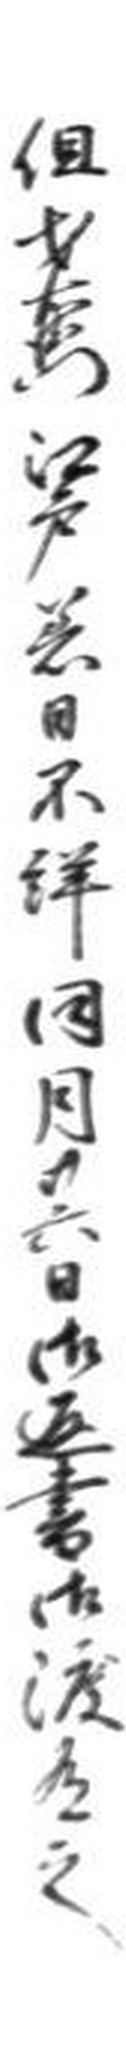但才右衛門江戸着日不詳同月廿六日御返書御渡有之
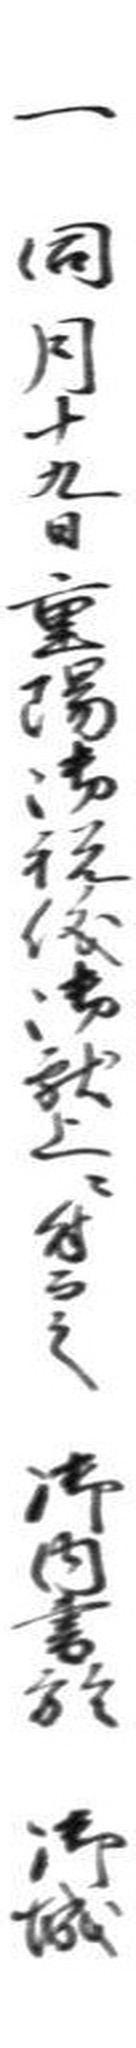一同月十九日重陽御祝儀御献上ニ付而之御内書於御城
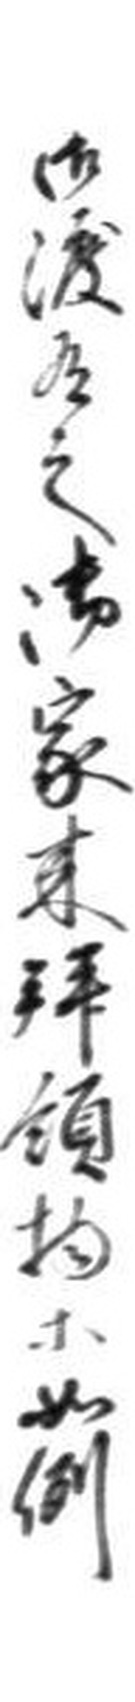御渡有之御家来拝領物等如例
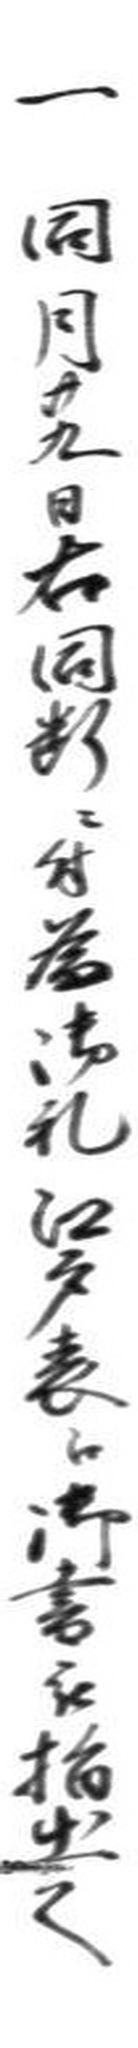一同月廿九日右同断ニ付為御礼江戸表江御書被指出之
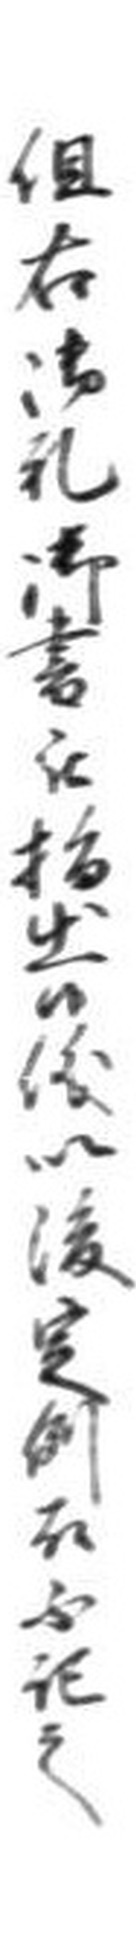但右御礼御書被指出候儀以後定例故不記之
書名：家譜 十三 綱昌公 従寛文元年到延宝五年
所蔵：福井県文書館 Fukui Prefectural Archives
